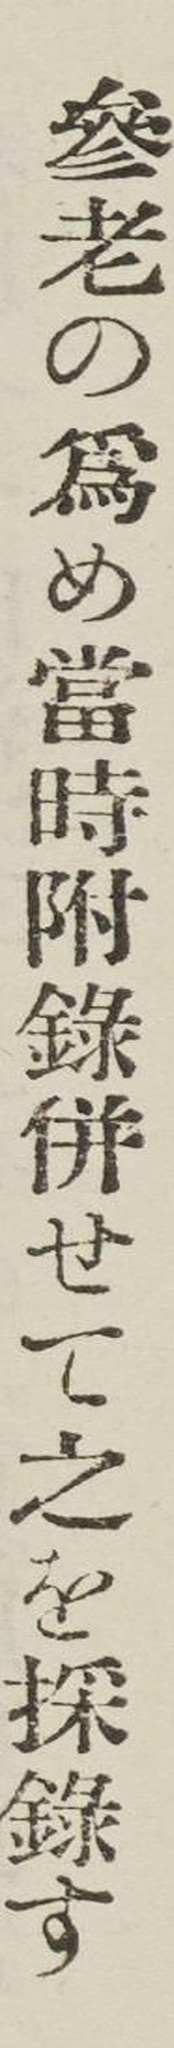参老の為め当時附録併せて之を採録す
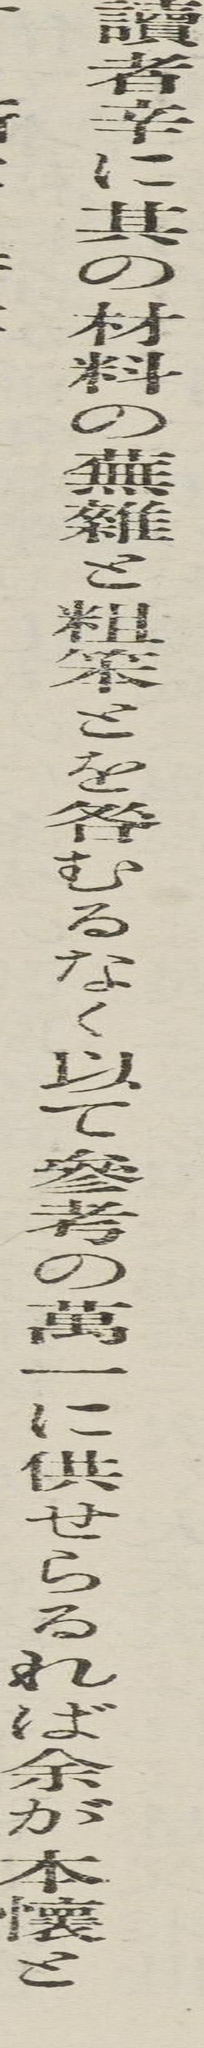読者辛に其の材料の蕪雑と粗笨とを咎むるなく以て参考の万一に供せらるれば余が本懐と
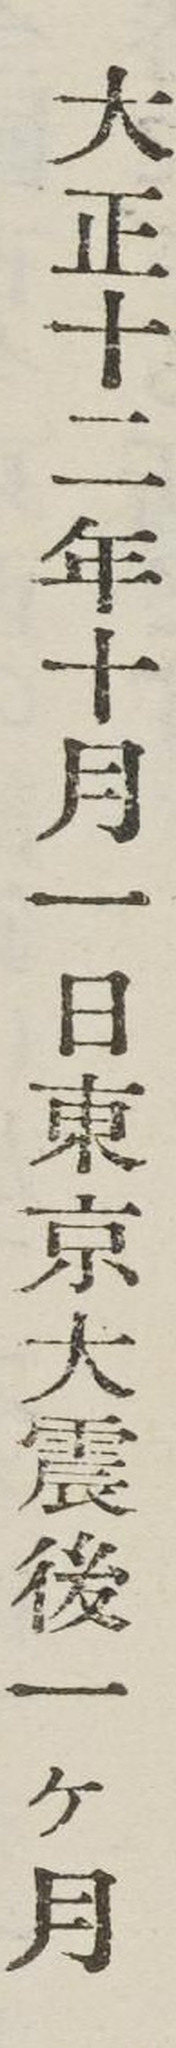大正十二年十月一日東京大震後一ヶ月
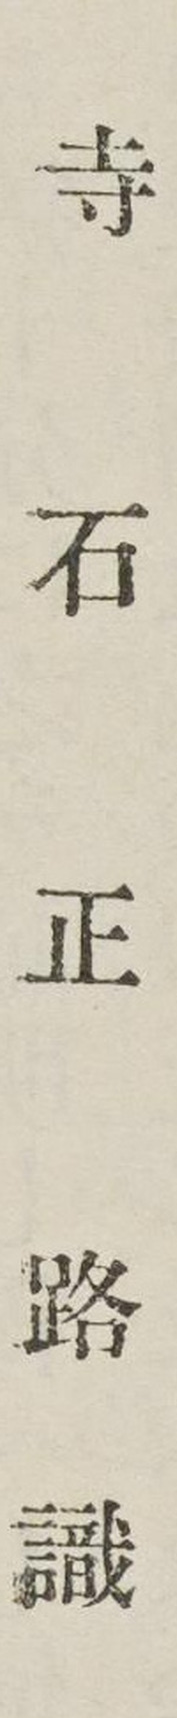寺石正路識
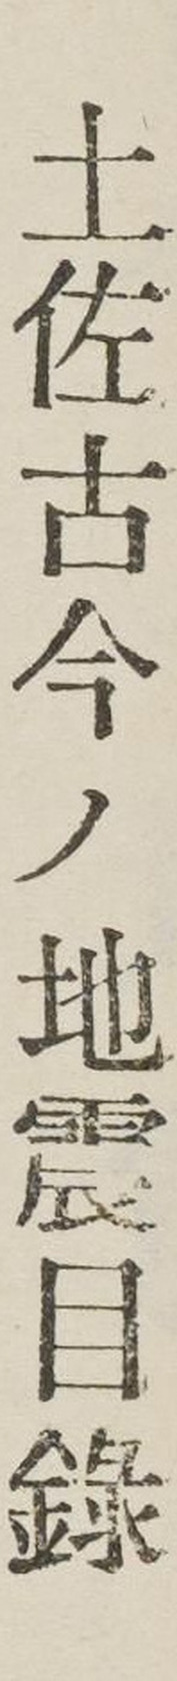土佐古今ノ地震目録

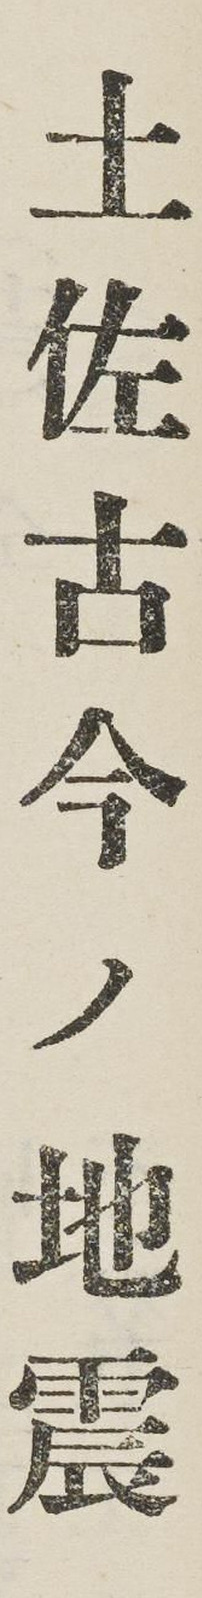土佐古今ノ地震
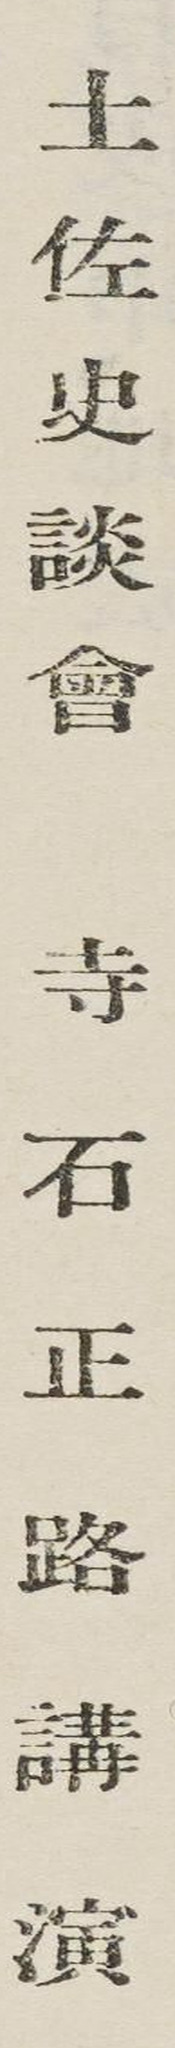土佐史談会寺石正路講演
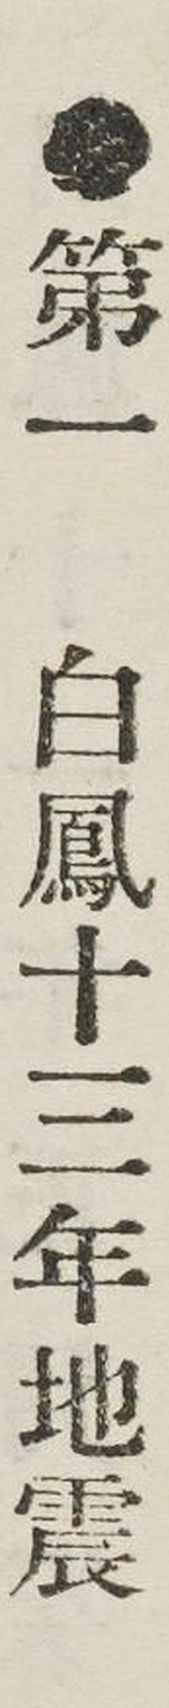●第一白鳳十三年地震
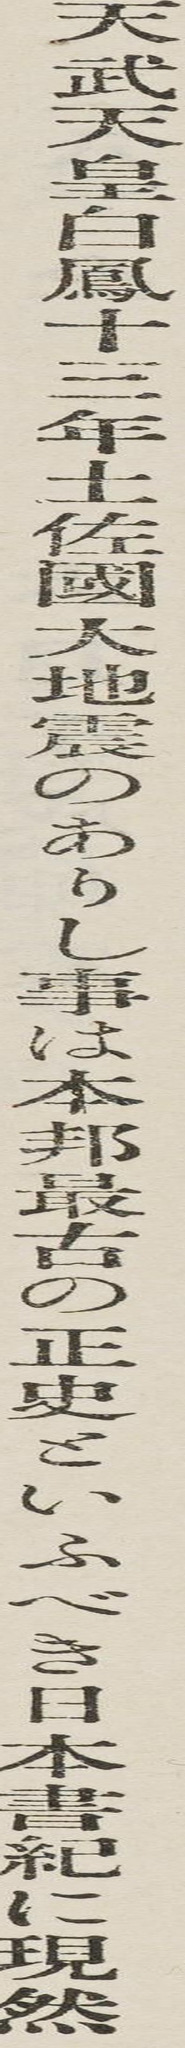天武天皇白鳳十三年土佐国大地震のありし事は本邦最古の正史といふべき日本書紀に現然
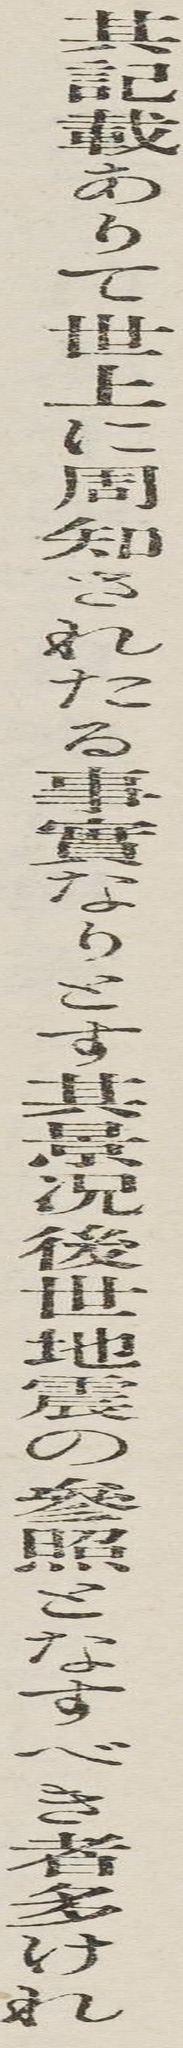其記載ありて世上に周知されたる事実なりとす其景況後世地震の参照となすべき者多けれ
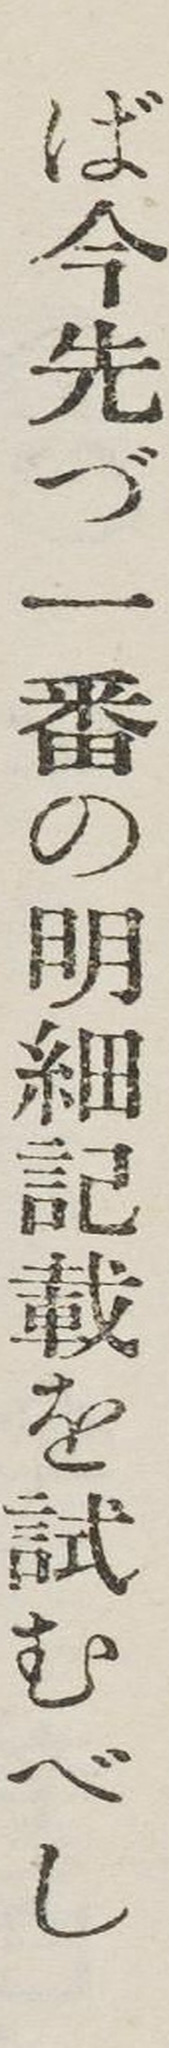ば今先づ一番の明細記載を試むべし
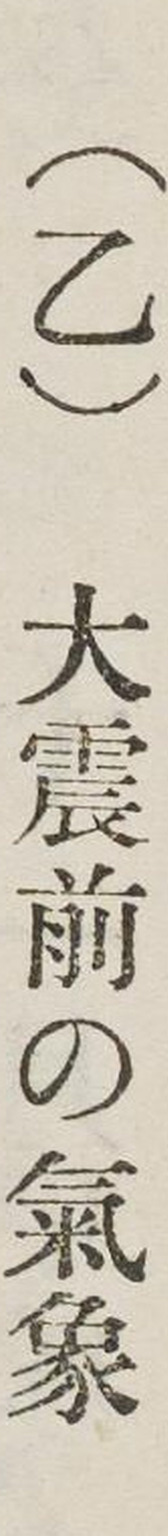大震前の気象
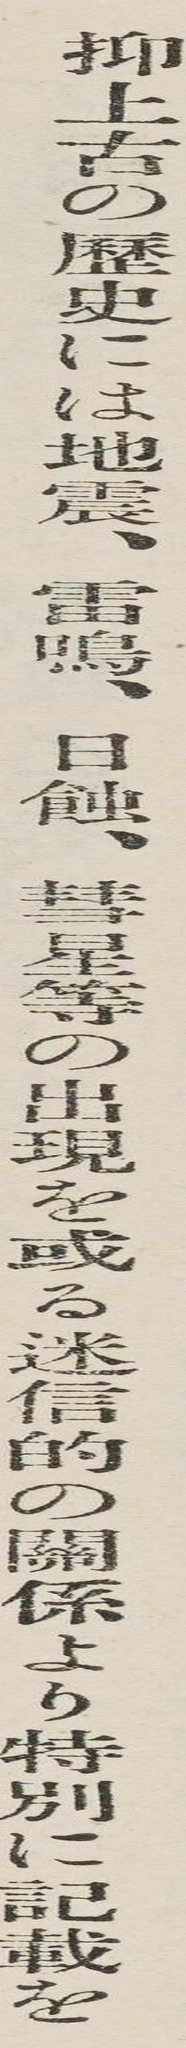抑上古の歴史には地震、雷鳴、日蝕、彗星等の出現を或る迷信的の関係より特別に記載を
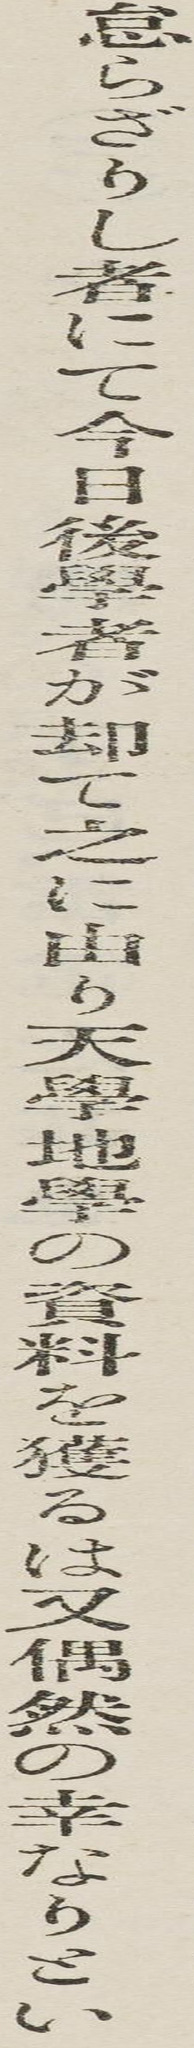怠らざりし者にて今日後学者が却て之に由り天学地学の資料を獲るは又偶然の幸なりとい
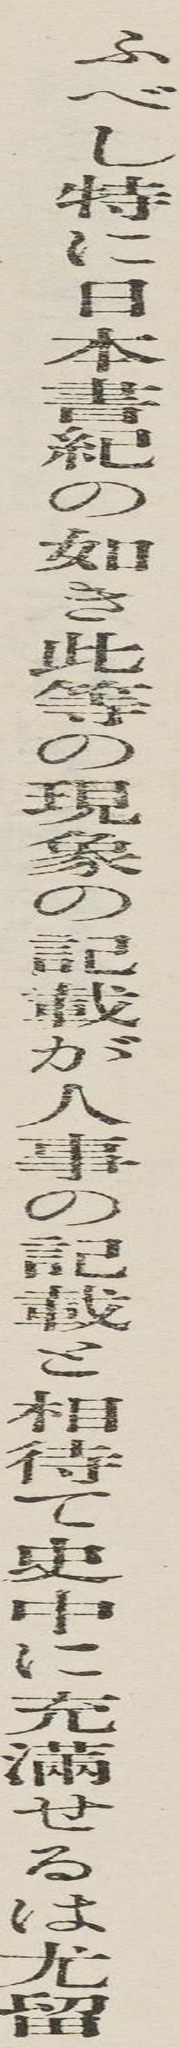ふべし特に日本書紀の如き此等の現象の記載が人事の記載と相待て史中に充満せるは尤留
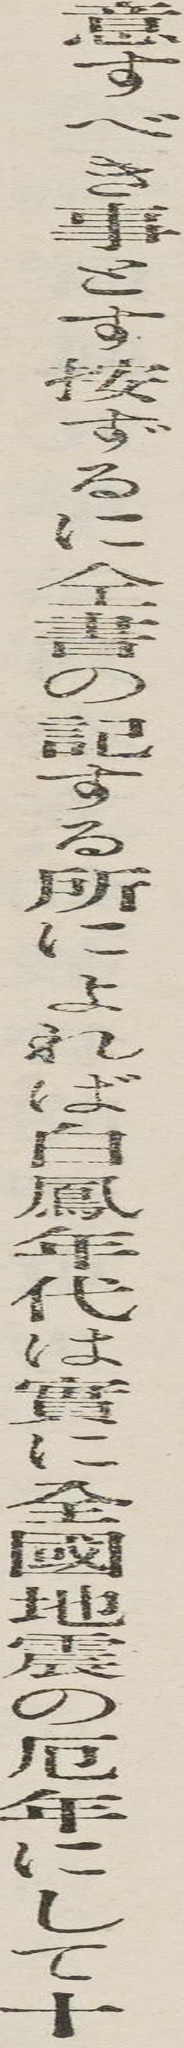意すべき事とす按ずるに同書の記する所によれば白鳳年代は実に全国地震の厄年にして十
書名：土佐古今ノ地震
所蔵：東京大学地震研究所図書室 Earthquake Research Institute Library, The University of Tokyo, JAPAN
